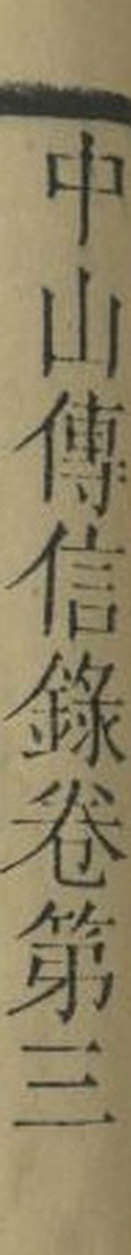中山伝信録巻第三

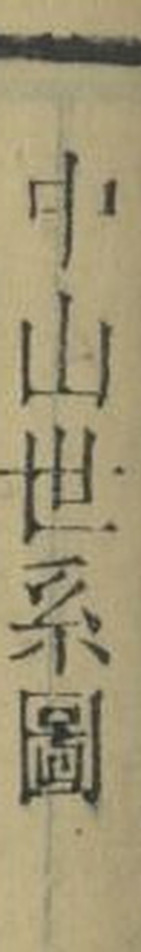中山世系図

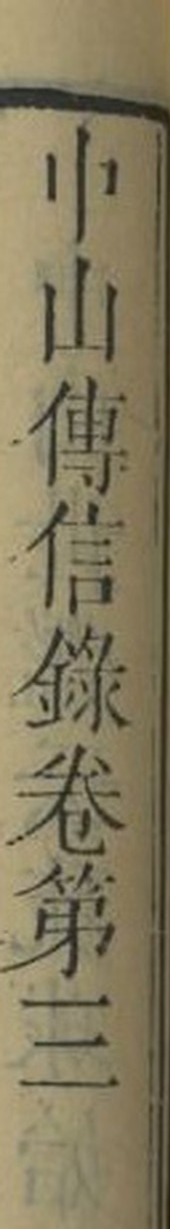中山伝信録巻第三
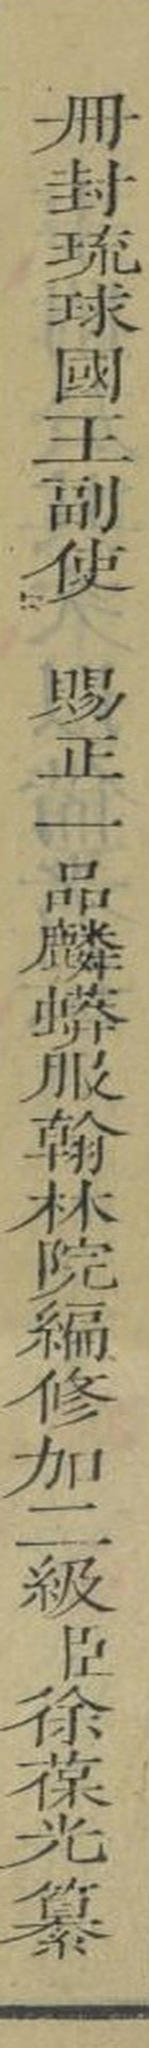冊封琉球国王副使賜正一品麟蟒服翰林院編修加二級臣徐葆光纂
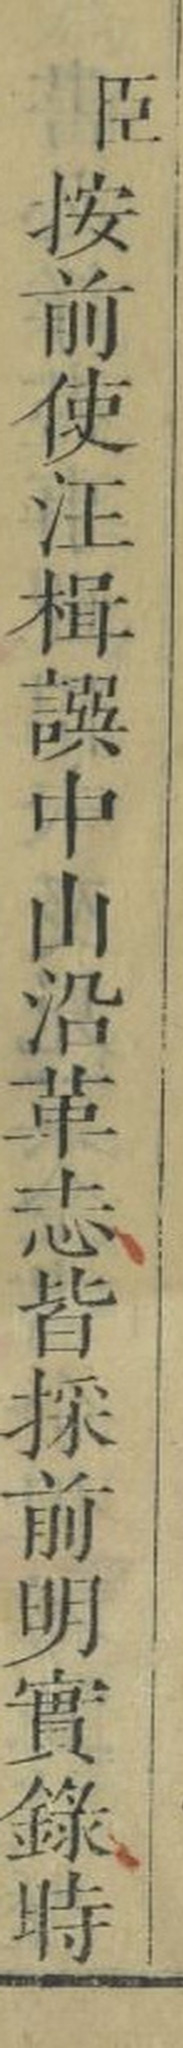臣按前使汪楫誤中山沿革志皆採前明実録時
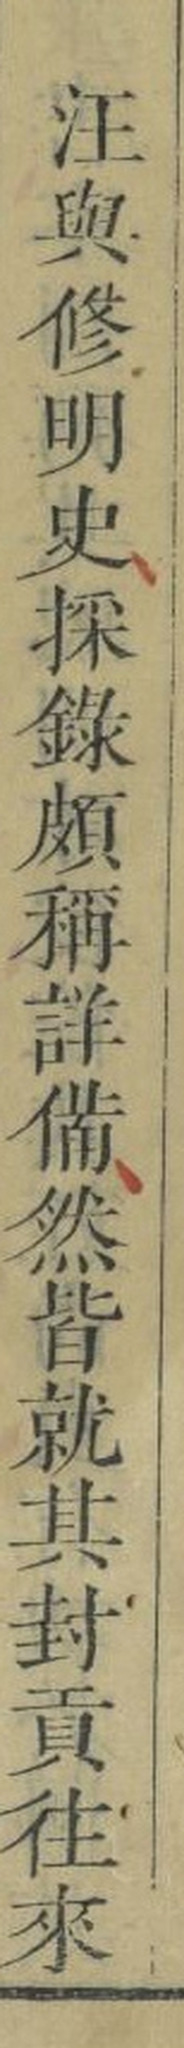汪与修明史採録頗称詳備然皆就其封貢往来
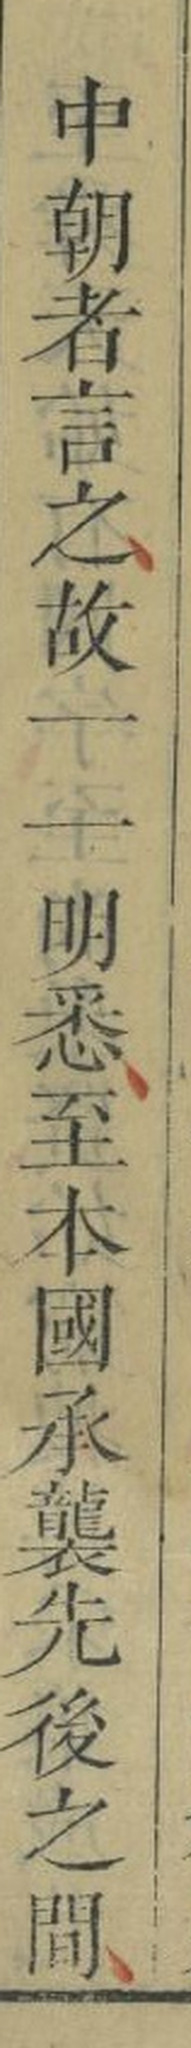中朝者言之故一一明悉至本国承襲先後之間
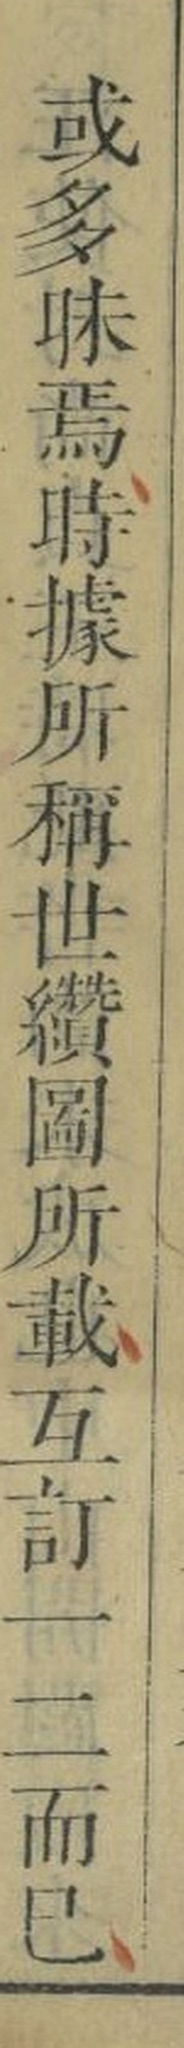或多昧焉時拠所称世纘図所載互訂一二而已
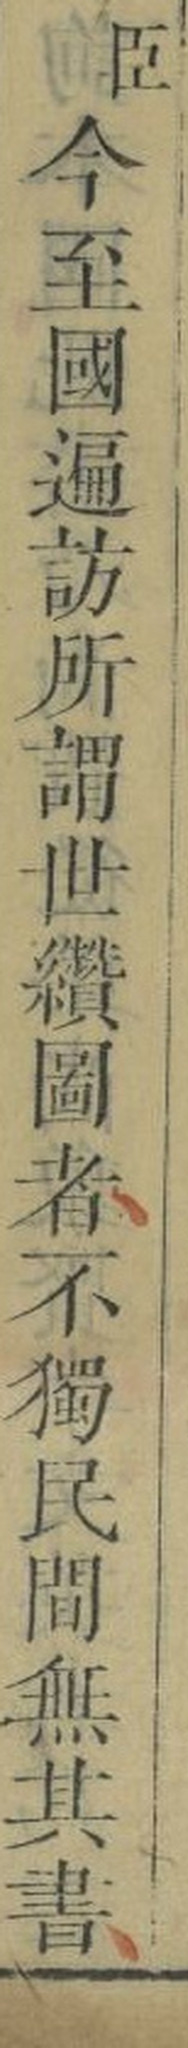臣今至国遍訪所謂世纘図者不独民間無其書
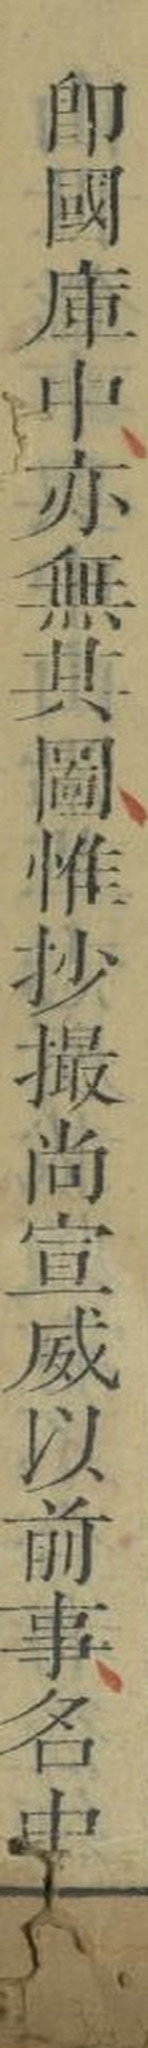即国庫中亦無其図惟抄撮尚宣威以前事名中

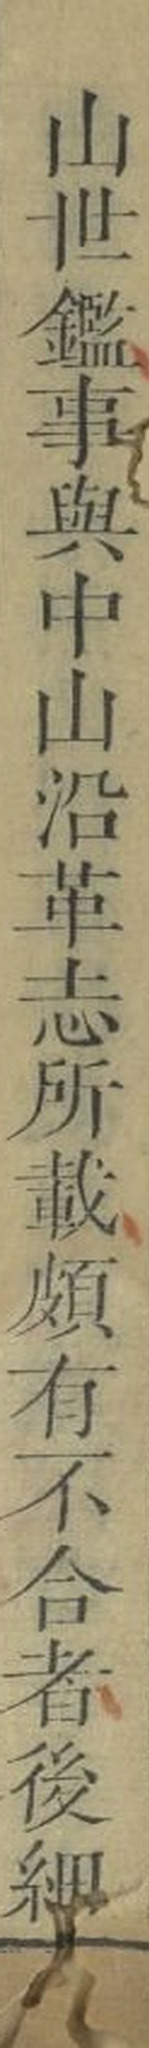山世鑑事与中山沿革志所載頗有不合者後細
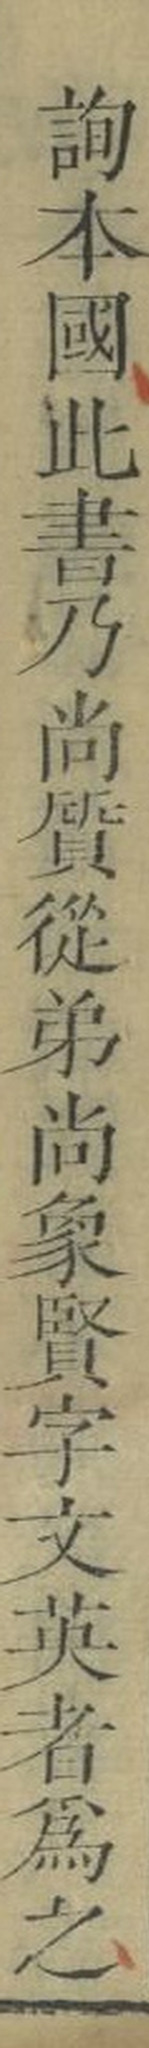詢本国此書乃尚質従弟尚象賢字文英者為之
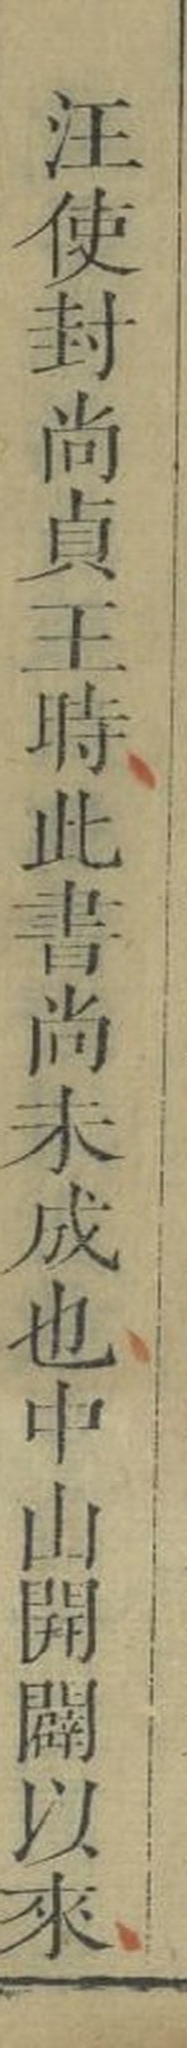汪使封尚貞王時此書尚未成也中山開闢以来
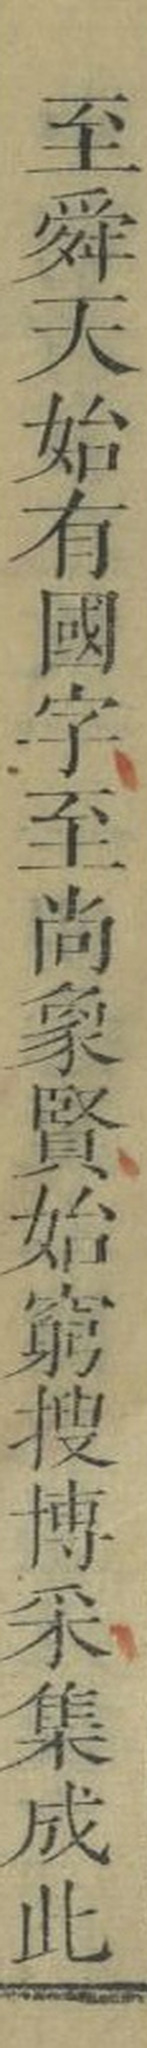至舜天始有国字至尚象賢始窮捜博采集成此
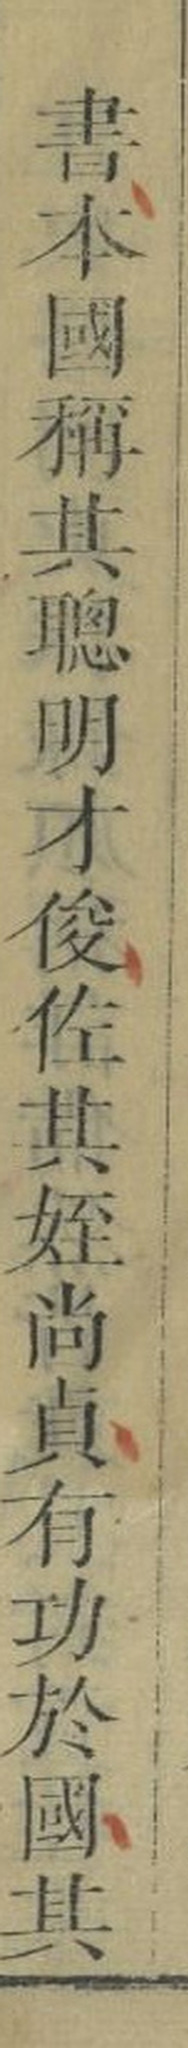書本国称其聡明才俊佐其姪尚貞有功於国其
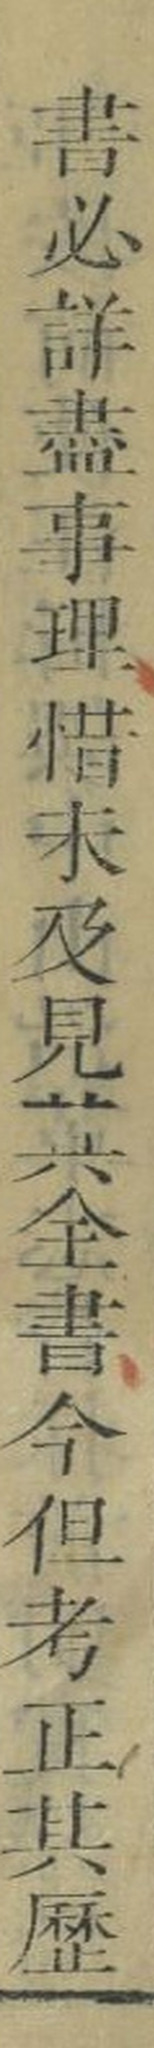書必詳尽事理惜未及見其全書今但考正其歴
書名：中山伝信録 巻三
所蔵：University of the Ryukyus Library
